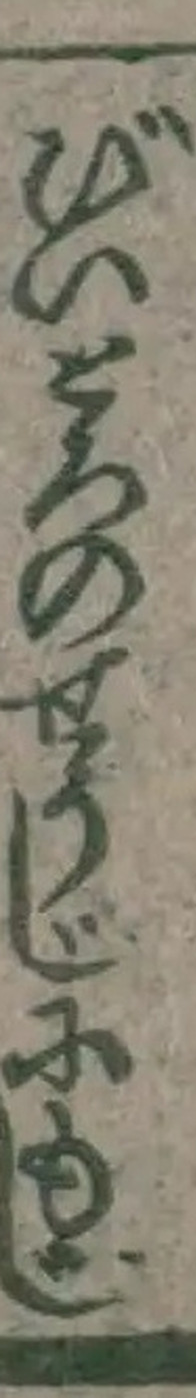びいとろのせうじにもし
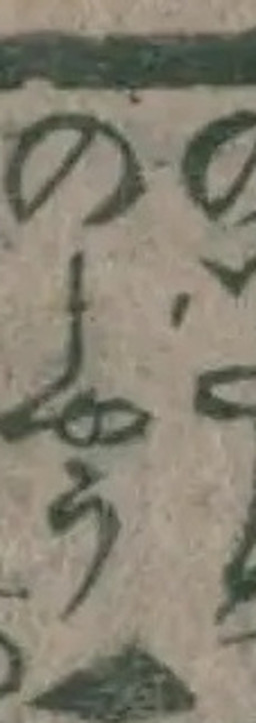のしやう
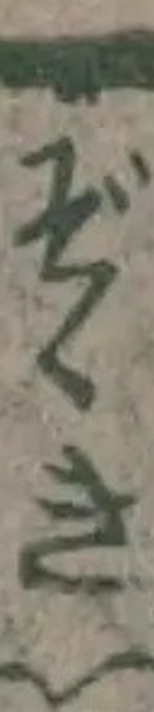ぞくき
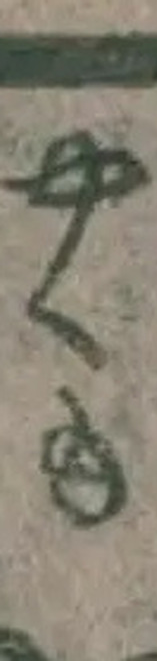やくも
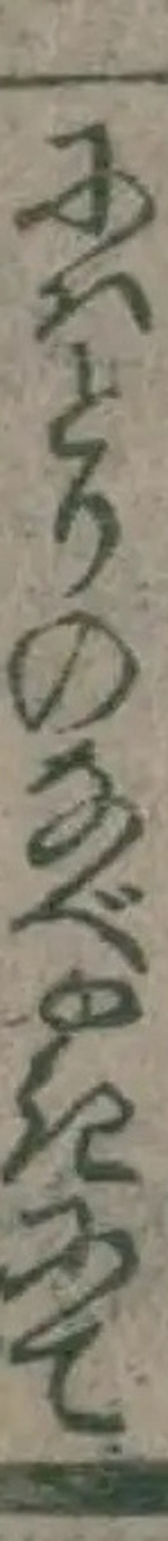にはとりのなべやきにて
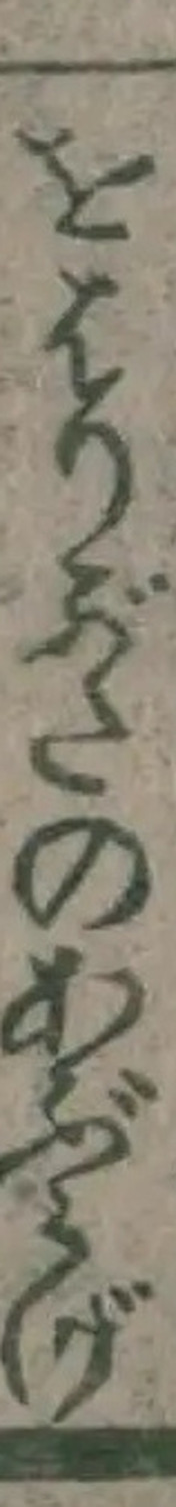をはりぶたのあぶらげ
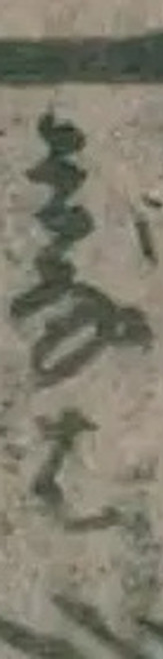みなは
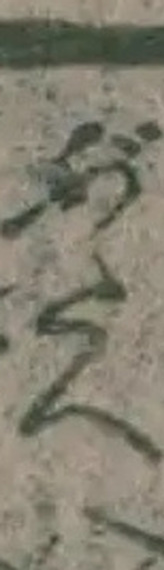ぶたへ
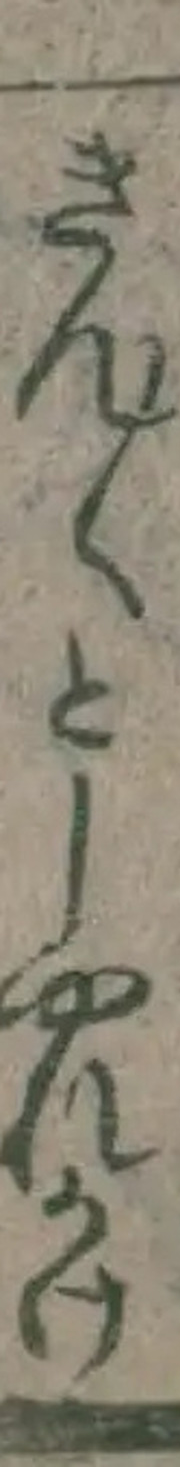きん〳〵としゃれかけ
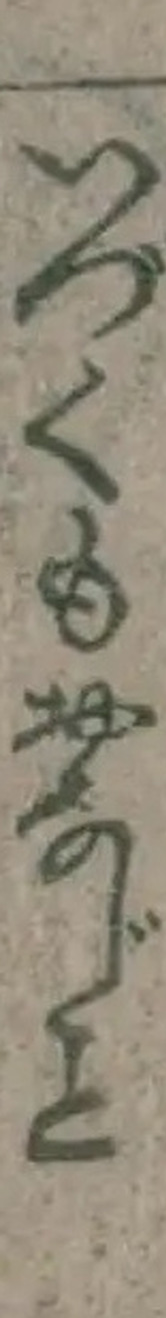いづくもおなじこと
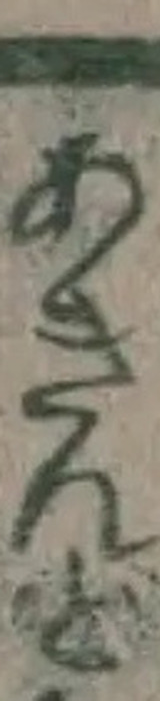あきんど
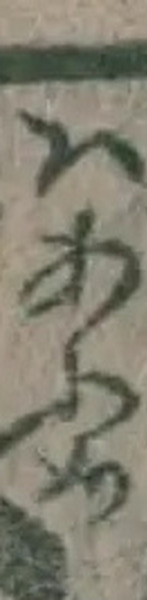はあふめ

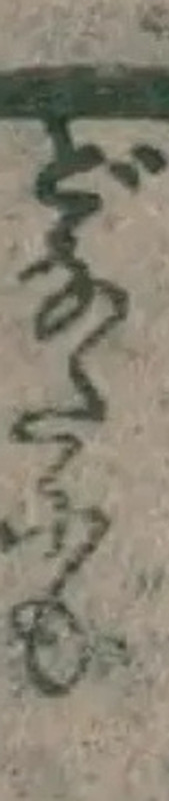どなたにも
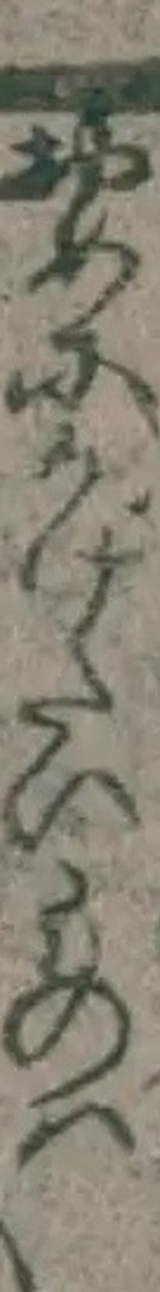おめにかけたいものは
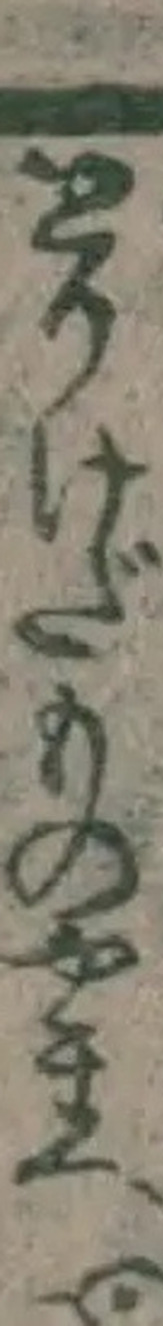とりけだものやまへ
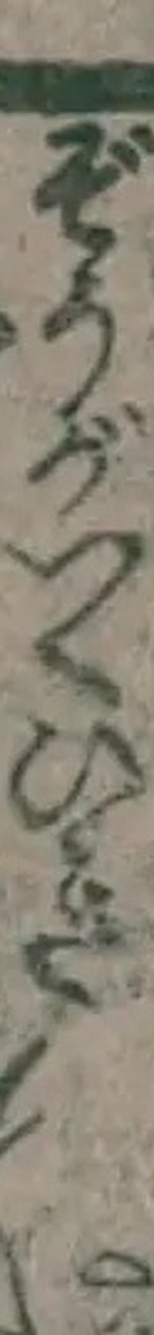ぞうがいくひき
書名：縦筒放唐の噺 3巻
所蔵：国立国会図書館 National Diet Library, JAPAN
